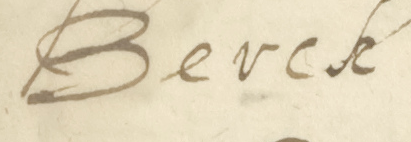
Berck
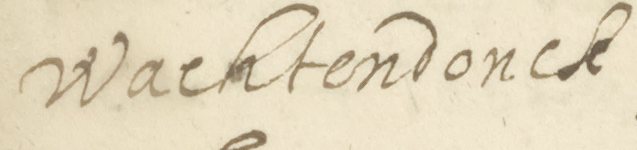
Wachtendonck
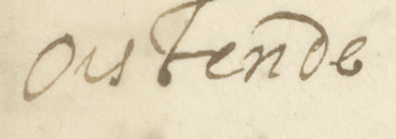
Oistende
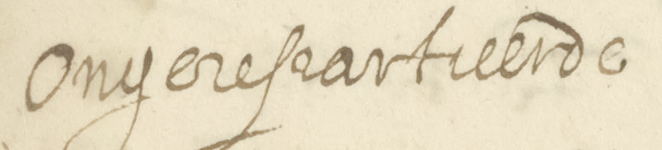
ongerepartieerde
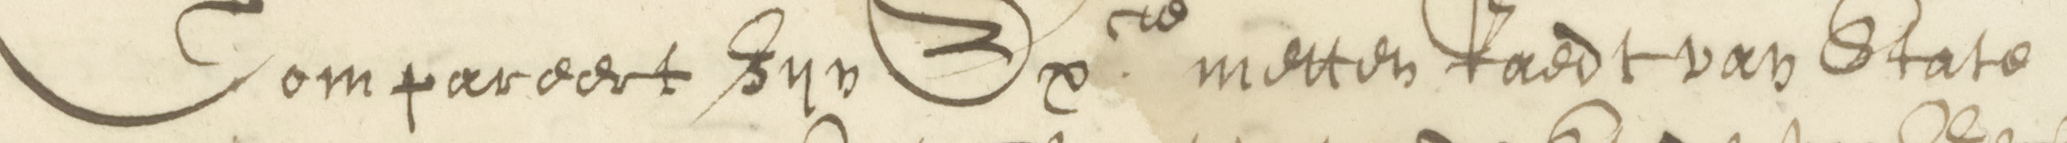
Compareert zyn Excie. metten Raedt van State
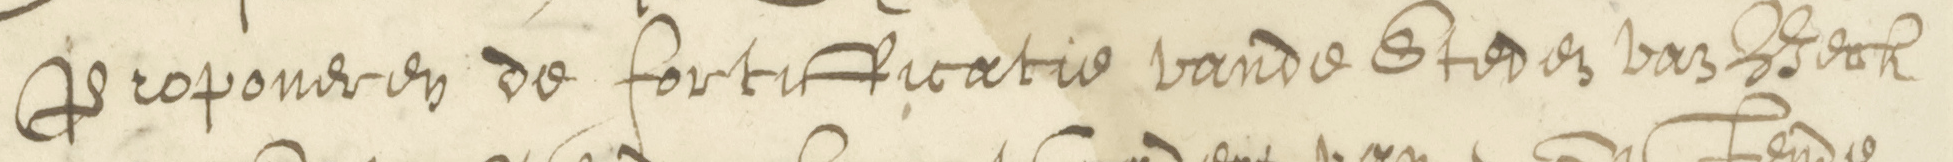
proponeren de fortifficatie vande Steden van Berk
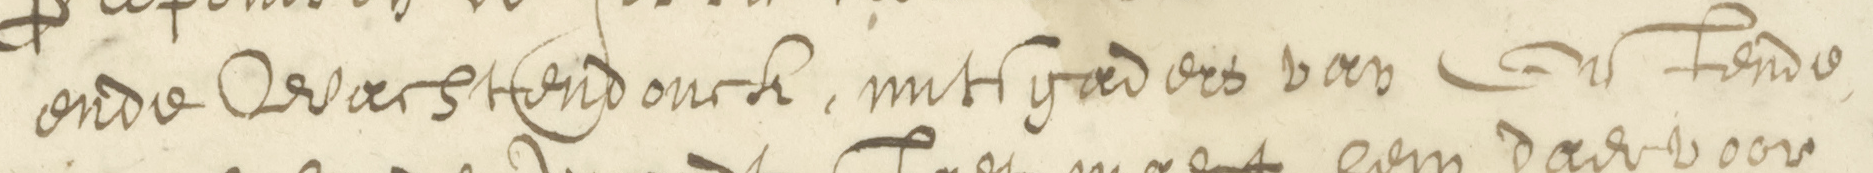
ende Wachtendonck, mitsgaders van Oistende
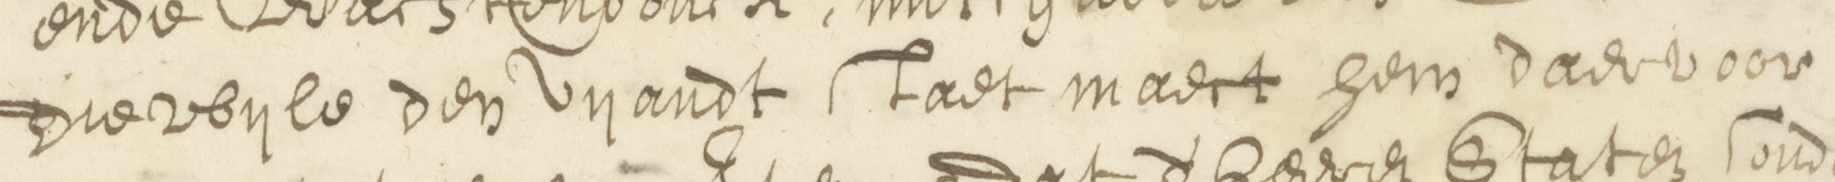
diewyle den vyandt staet maect hem daervoor
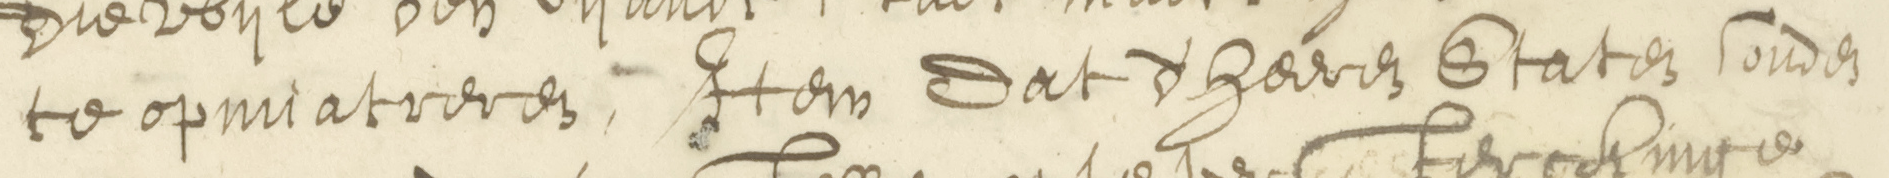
te opiniatreren. Item dat d‛heeren Staten souden
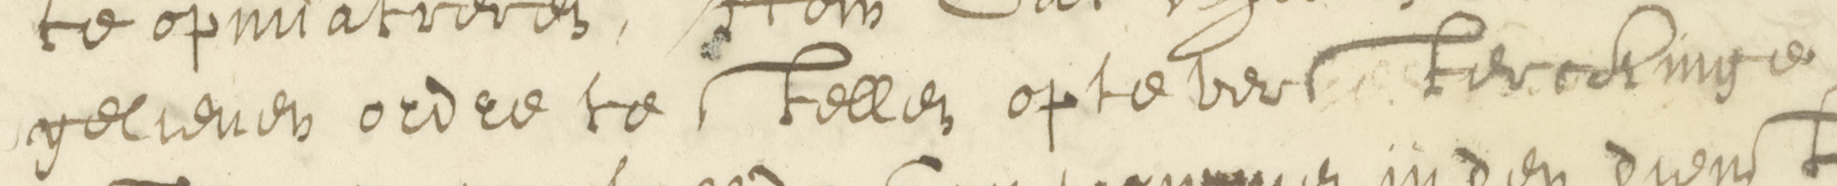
gelieuen ordre te stellen opte versterckinge
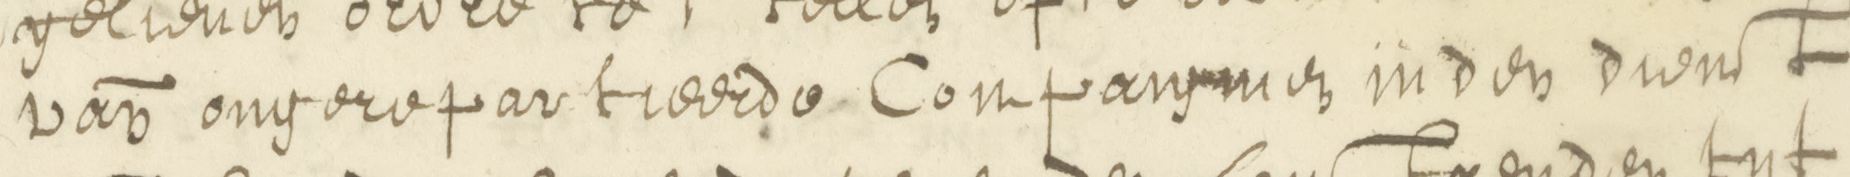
van ongerepartieerde Compaignien in den dienst
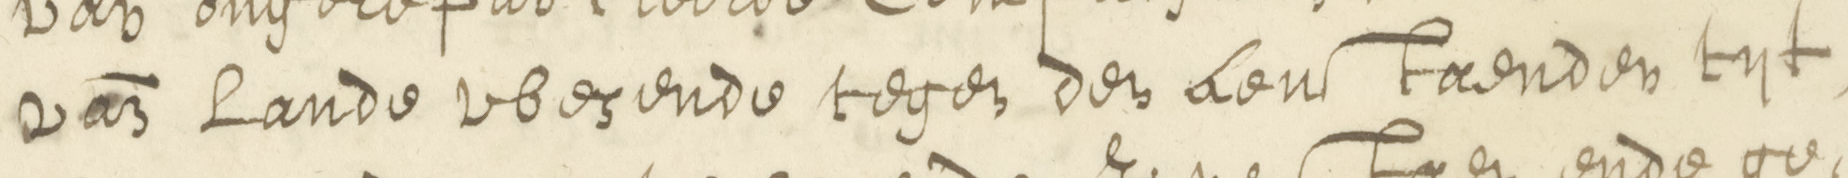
van Lande wezende tegen den aenstaenden tyt,
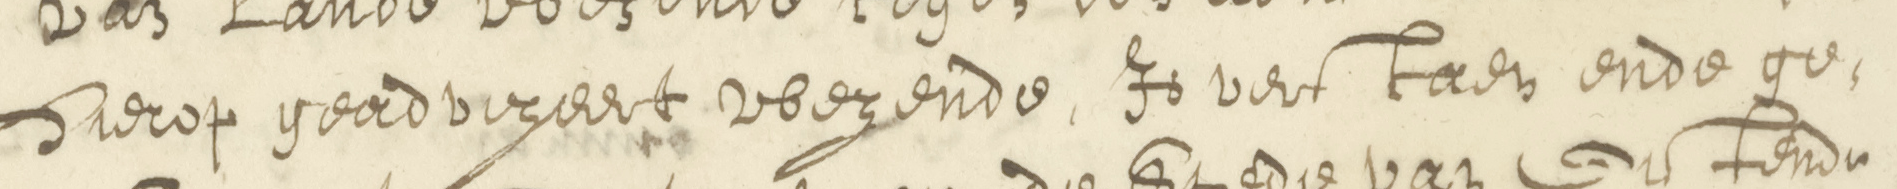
Hierop geadvizeert wezende, Is verstaen ende ge„
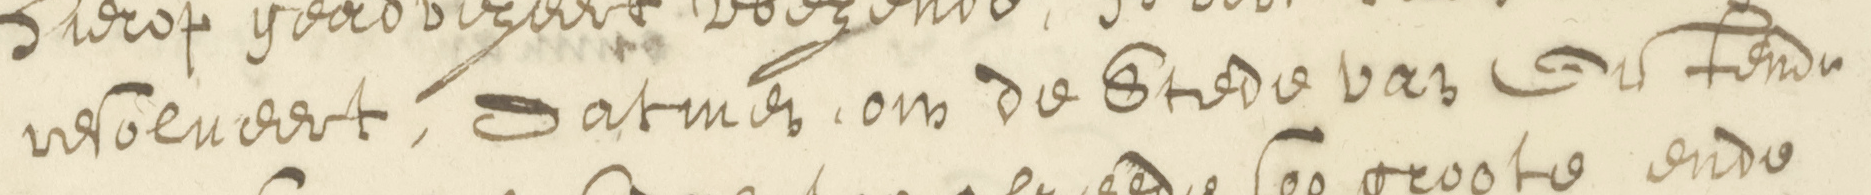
resolueert, datmen, om de Stede van Oistende
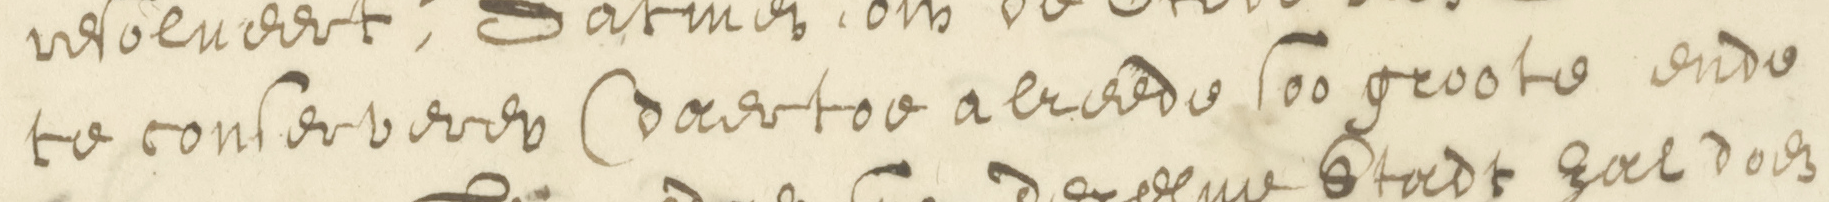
te conserveren (daertoe alreede soo groote ende
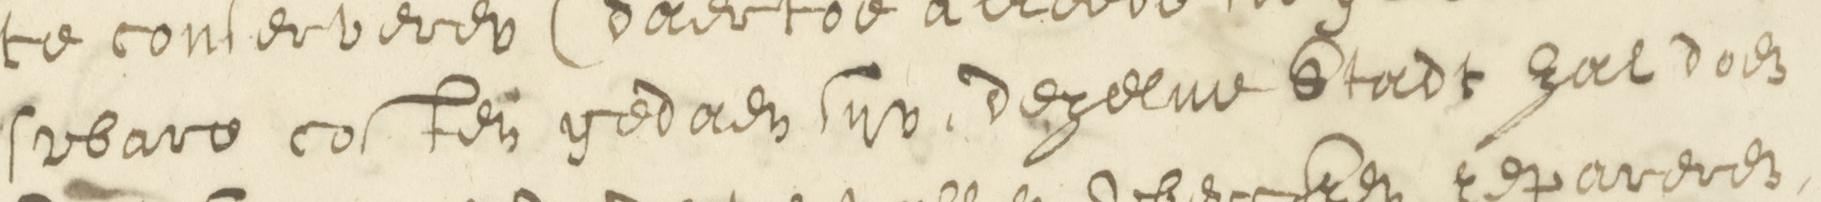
sware costen gedaen syn, dezelue Stadt zal doen
